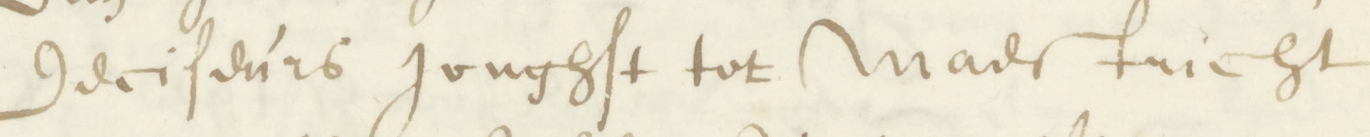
Deciseurs jonghst tot maestricht
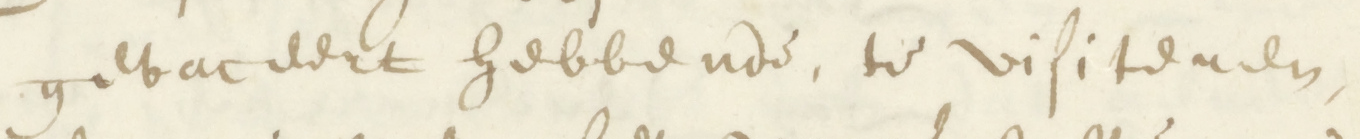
gevaceert hebbende, te visiteren,
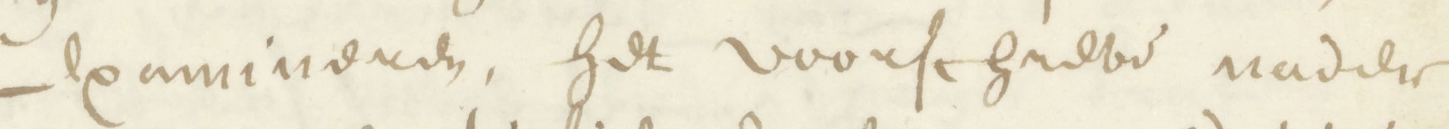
examineren, het voorschreve nader
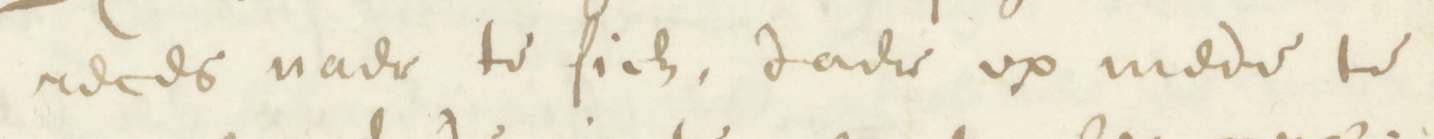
reces naer te sien, daer op mede te
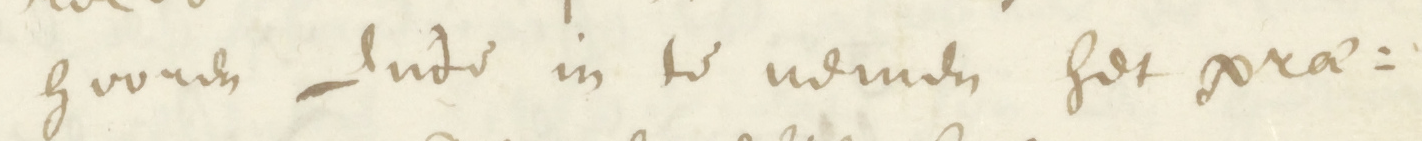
hooren ende in te nemen het præ„
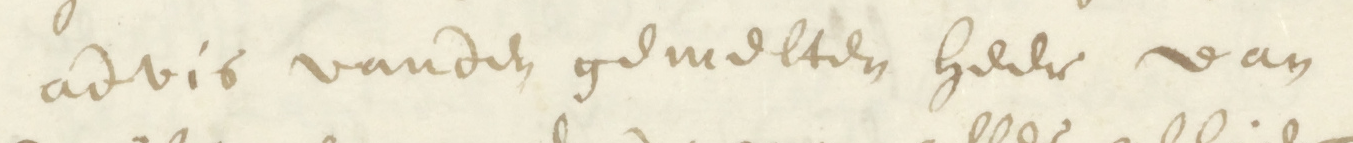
advis vanden gemelten heer van
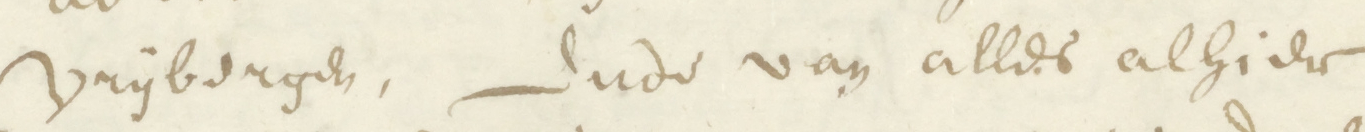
Vrijbergen, ende van alles alhier
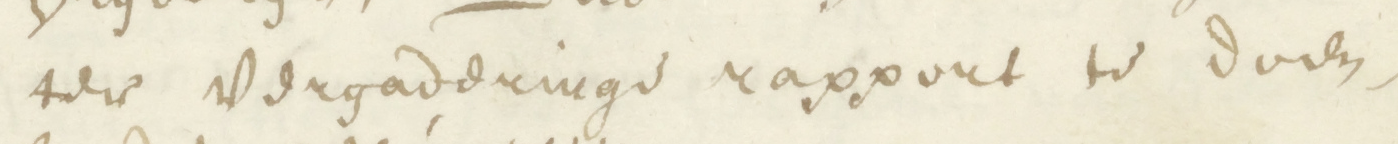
ter Vergaderinge rapport te doen
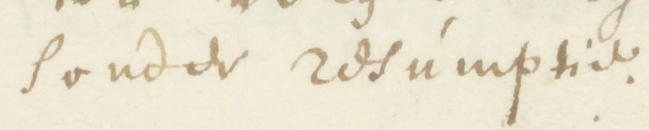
sonder resumptie.
